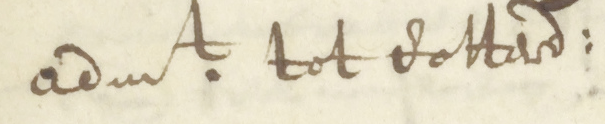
Admt. tot Rotterd:
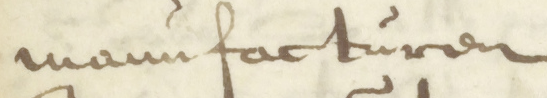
manufacturen
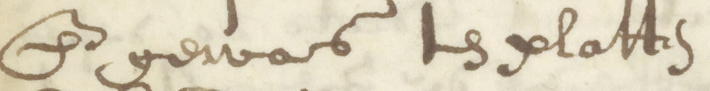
& gewas ten platten
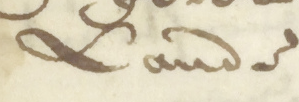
Lande
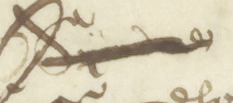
Sijnde
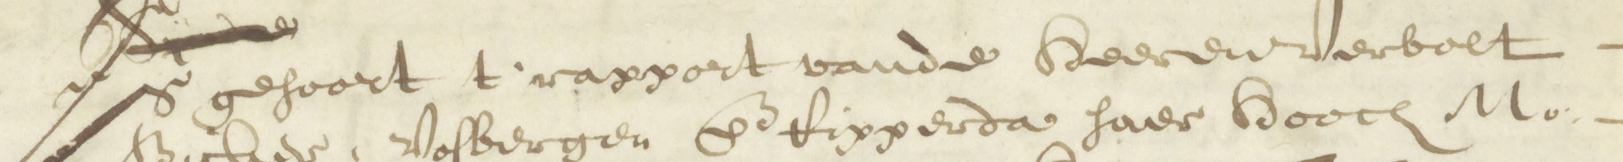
Is gehoort t' rapport vande Heeren Verbolt
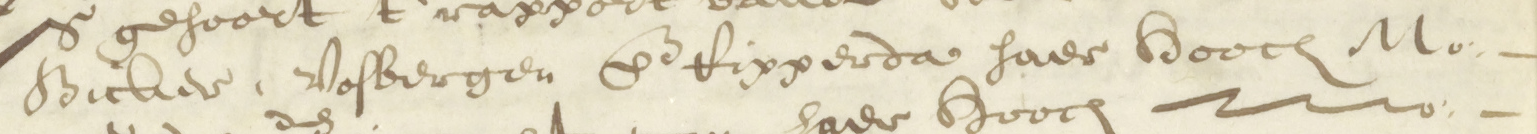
Bicker, Vosbergen & Ripperda haer Hooch Mo:-
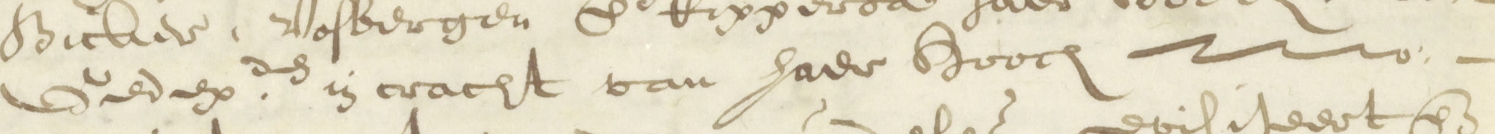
Gedepden. in cracht van haer Hooch Mo: -
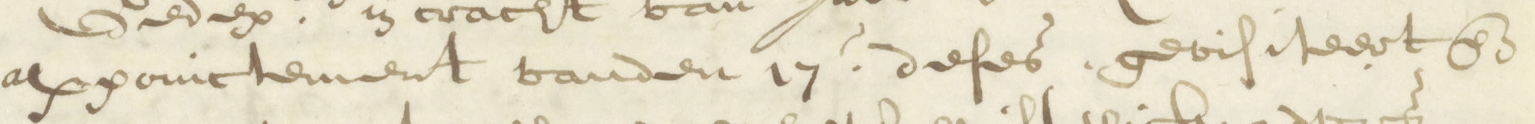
appoinctement vanden 17e. deses, gevisiteert &
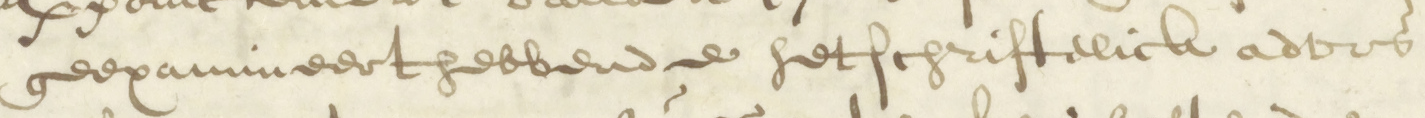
geexamineert hebbende het schriftelick advis
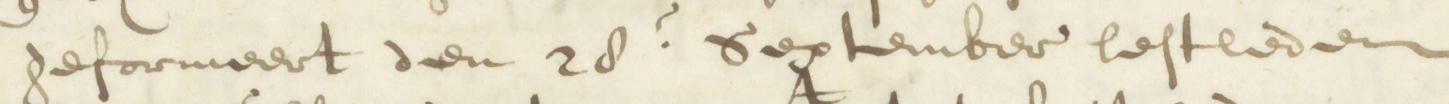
geformeert den 28e. September lestleden
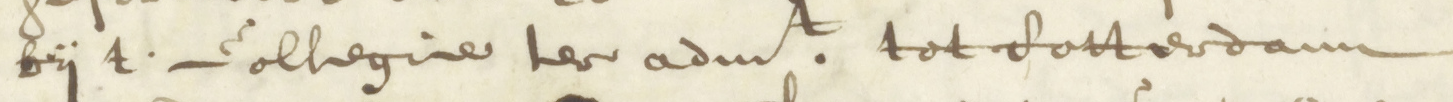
bij t'Collegie ter admt. tot Rotterdam
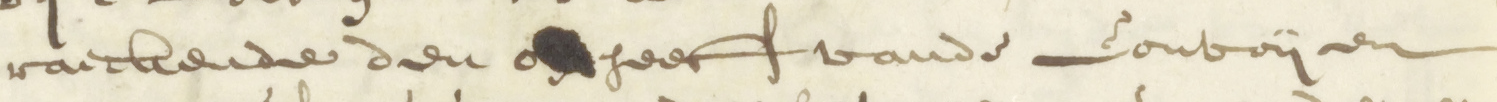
raeckende den opheeff vande Convoijen
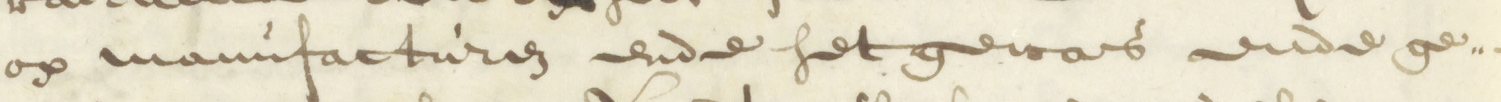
op manufacturen ende het gewas ende ge„,
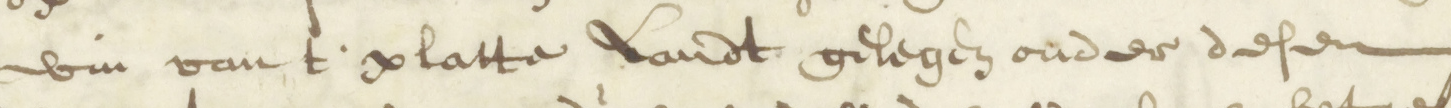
win van t' platte Landt gelegen onder desen
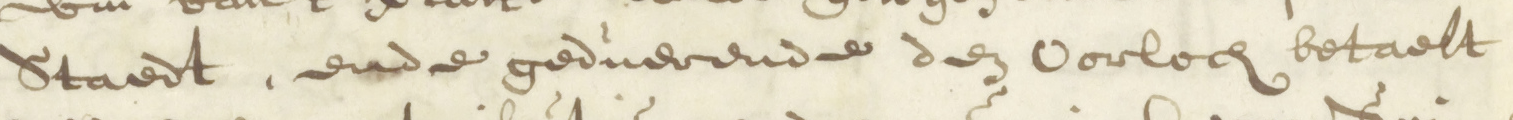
Staedt, ende geduerende den Oorloch betaelt
